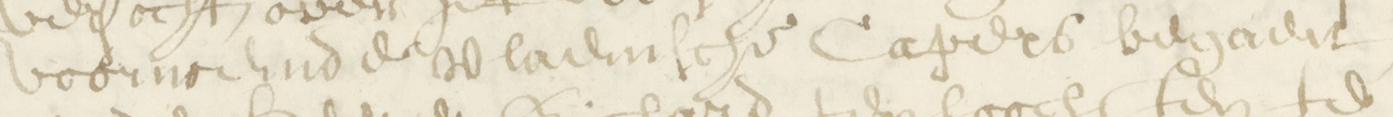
voornoemde Vlaemsche Capers begaen,
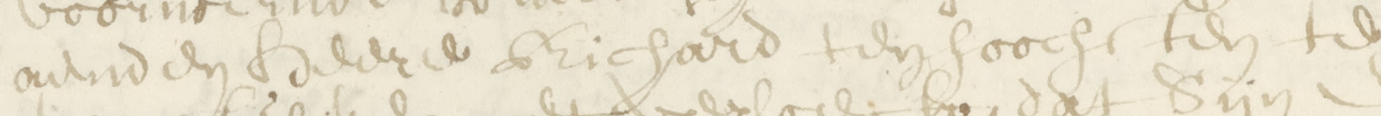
aenden Heere Richard ten hoochsten te
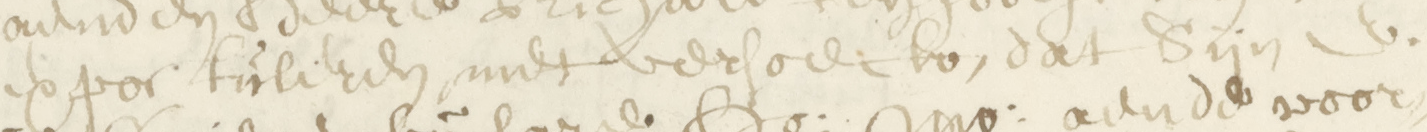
Expostuleren met versoeck, dat sijn E.
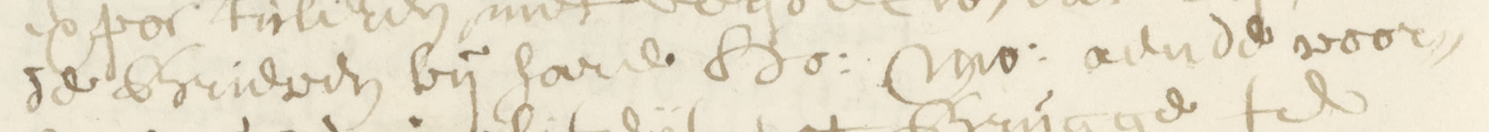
de Brieven bij hare Ho:Mo: aen de voor„
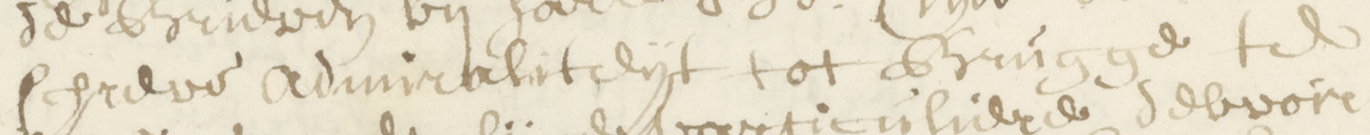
schreve Admiraliteijt tot Brugge te
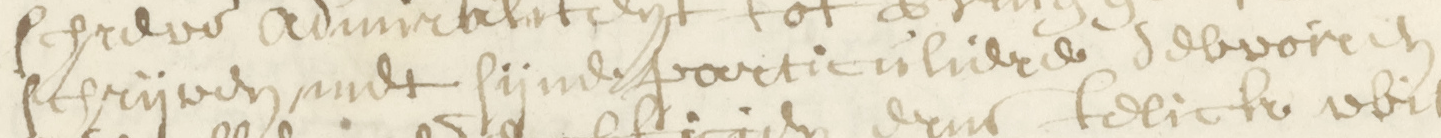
schrijven met sijne particuliere debvoiren
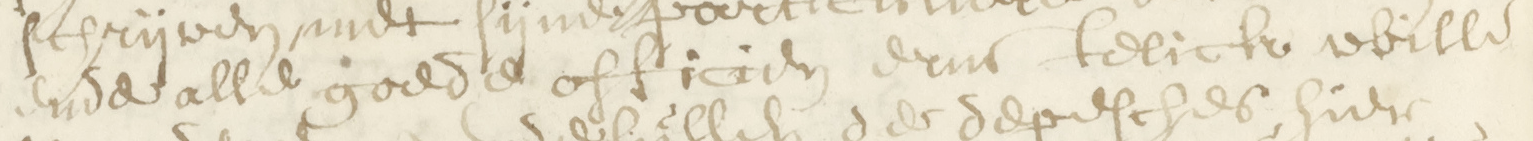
ende alle goede officien ernstelick wille
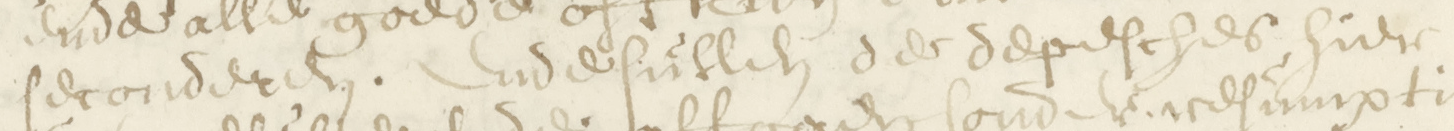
seconderen. Ende sullen de depesches hier
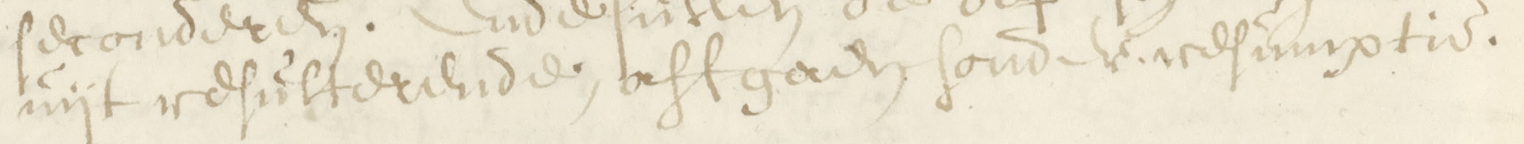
uijt resulterende, affgaen sonder resumptie.
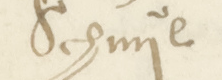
Schuijl
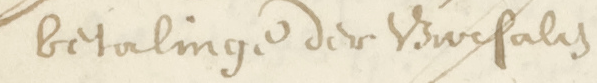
betalinge der Bursalen
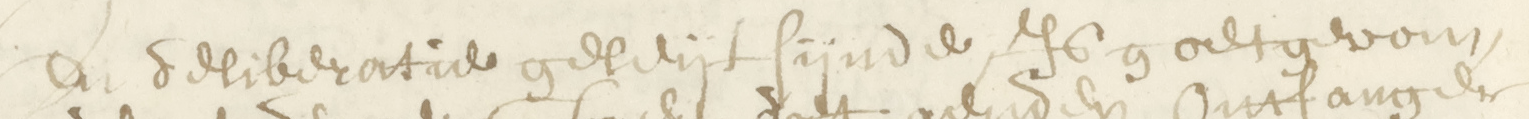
In deliberatie geleijt sijnde, Is goetgevon„
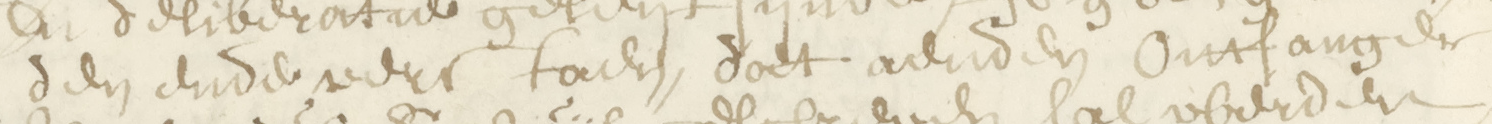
den ende verstaen, dat aenden Ontfanger
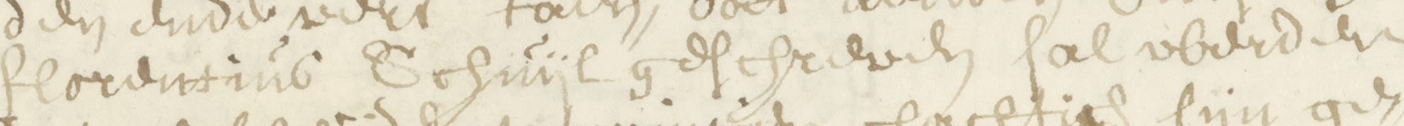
florentius Schuijl geschreven sal werden
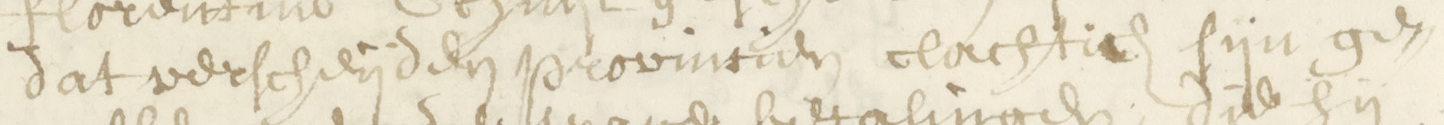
dat verscheijden provintien clachtich sijn ge„
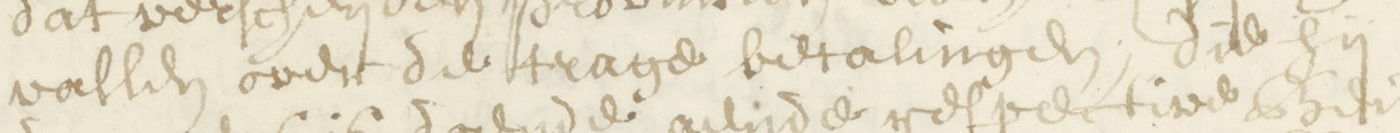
vallen over de trage betalingen; die hij
